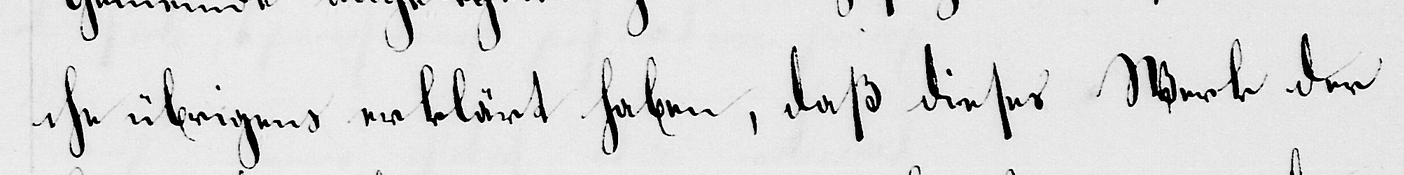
che übrigens erklärt haben, daß dieses Werk der
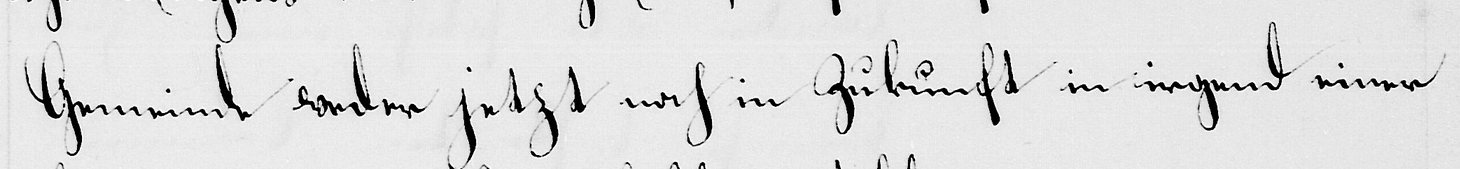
Gemeinde weder jetzt noch in Zukunft in irgend einer
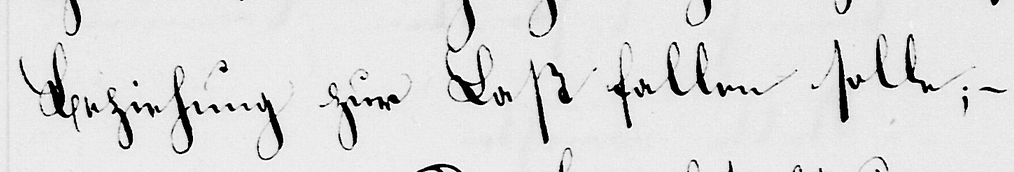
Beziehung zur Last fallen solle; –
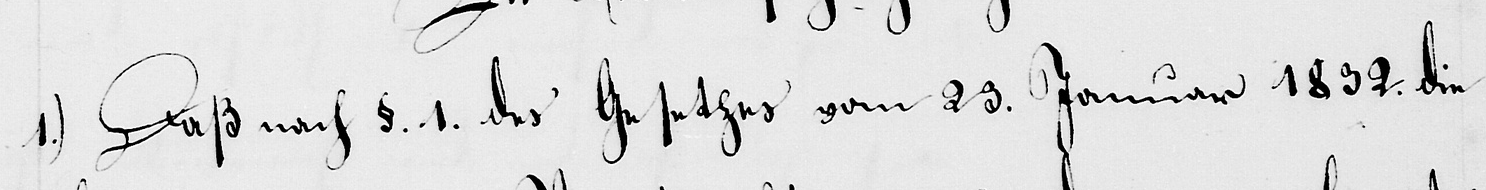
1.) Daß nach §. 1. des Gesetzes vom 23. Januar 1832. die
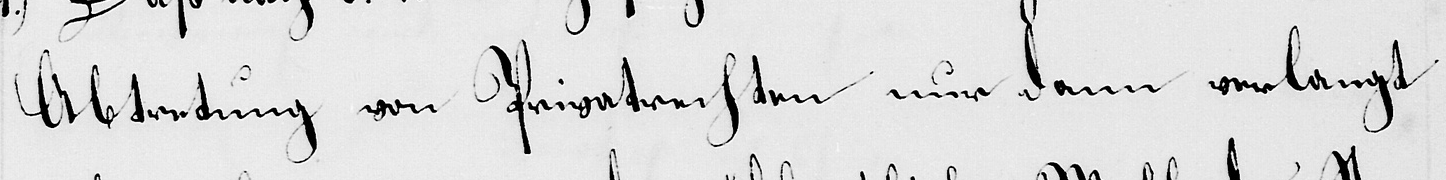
Abtretung von Privatrechten nur dann verlangt
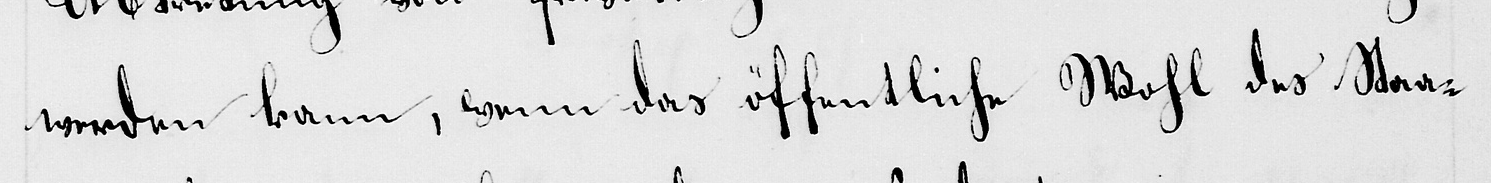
werden kann, wenn das öffentliche Wohl des Staa¬
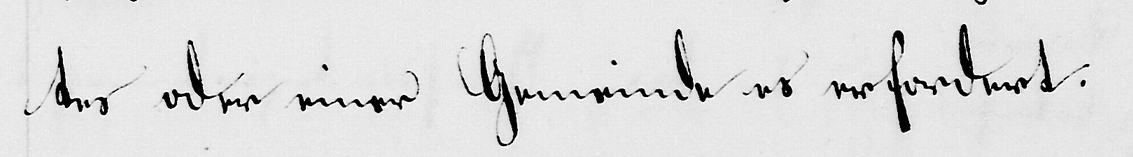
tes oder einer Gemeinde es erfordert.
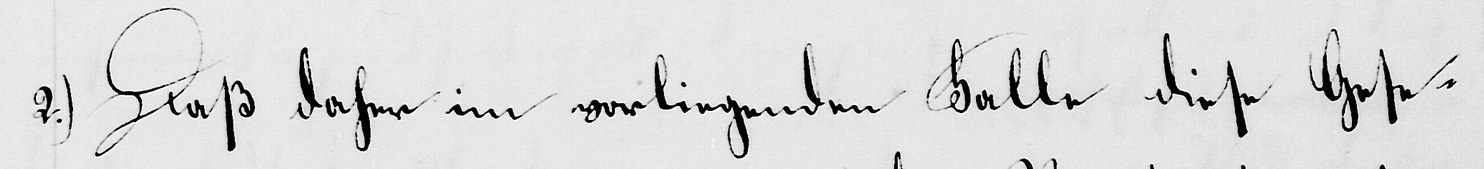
2.) Daß daher im vorliegenden Falle diese Gese¬
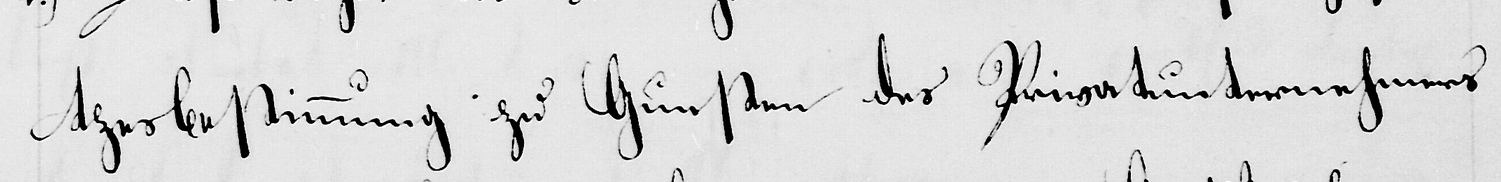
tzesbestimmung zu Gunsten des Privatunternehmens
